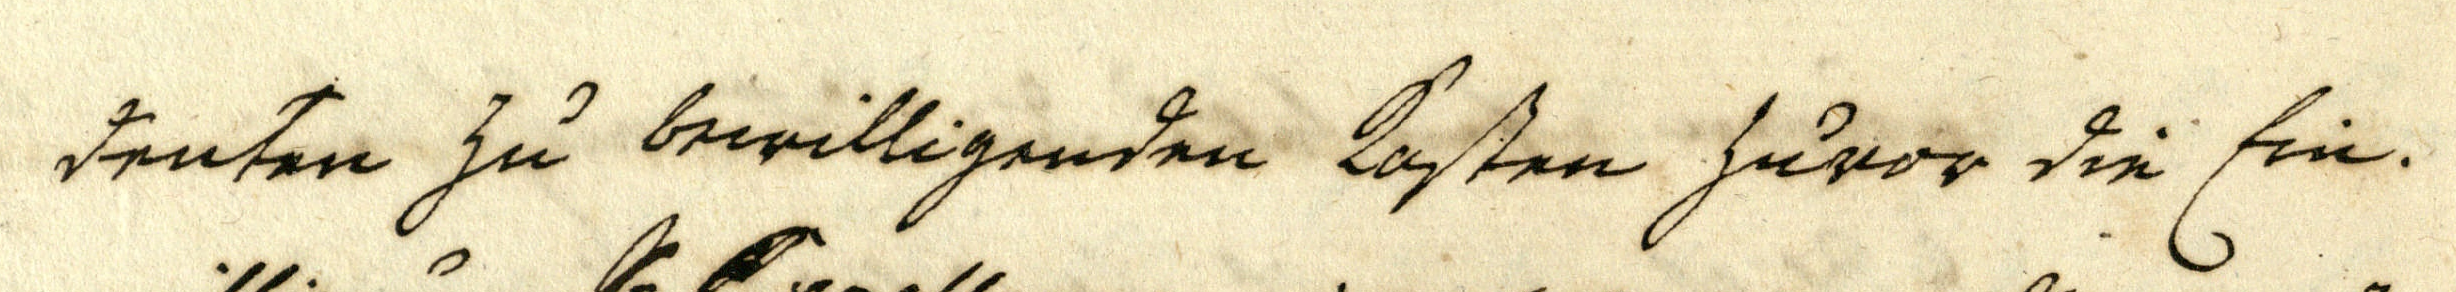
denten zu bewilligenden Kosten zuvor die Ein¬
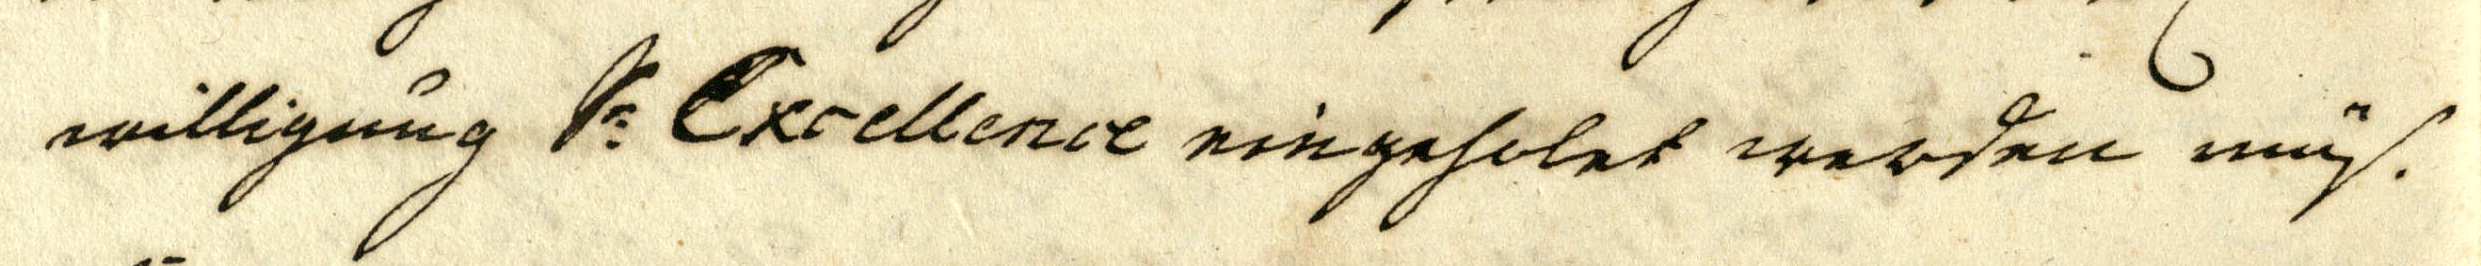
willigung Sr. Excellence eingeholet werden müs¬
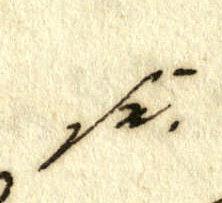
se.
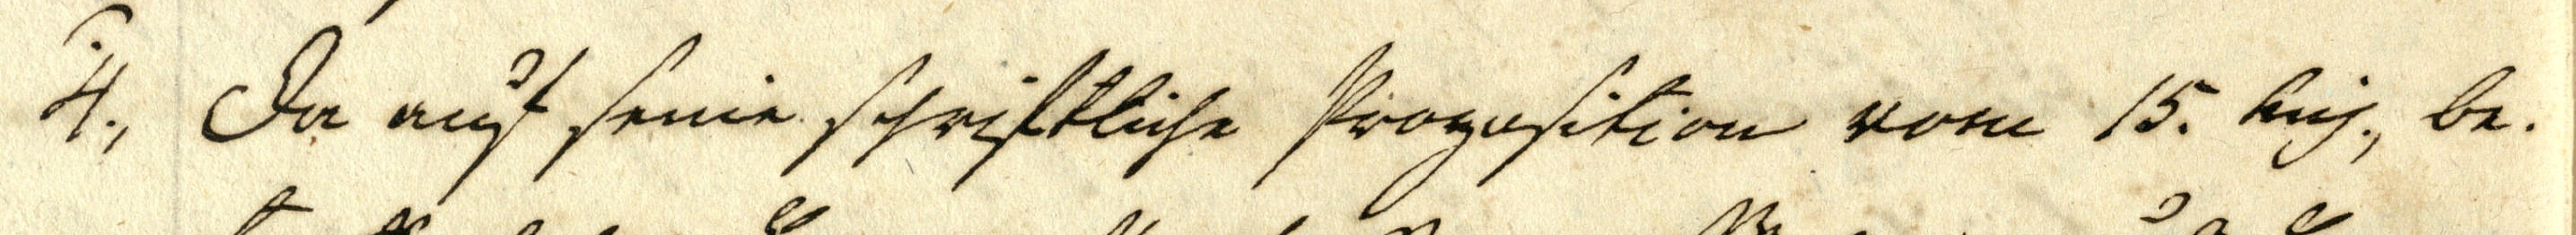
4., Da auf seine schriftliche Proposition vom 15. huj., be¬
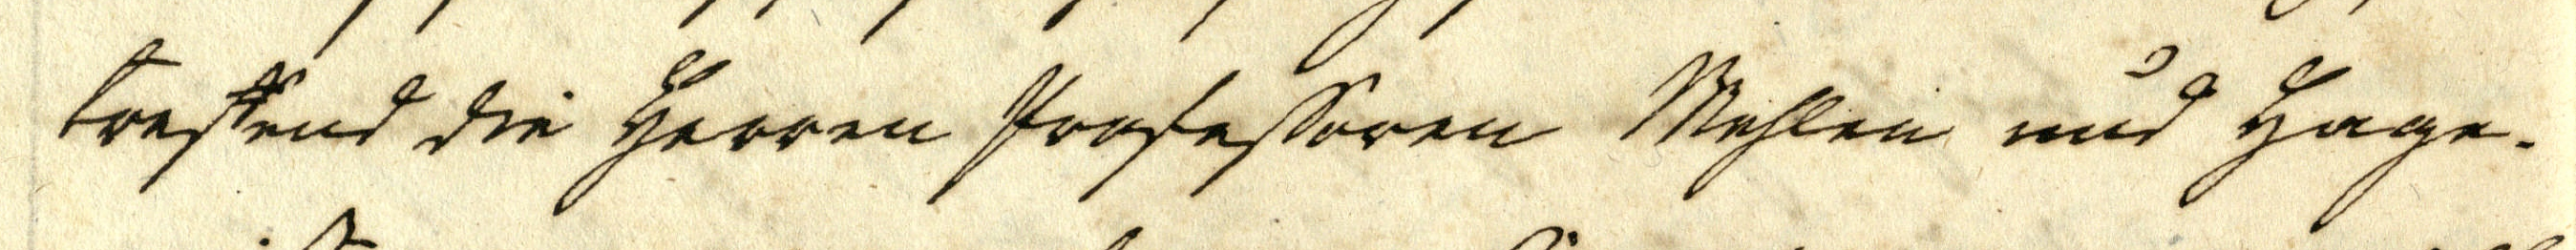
treffend die Herren Professoren Mehlen und Hage¬
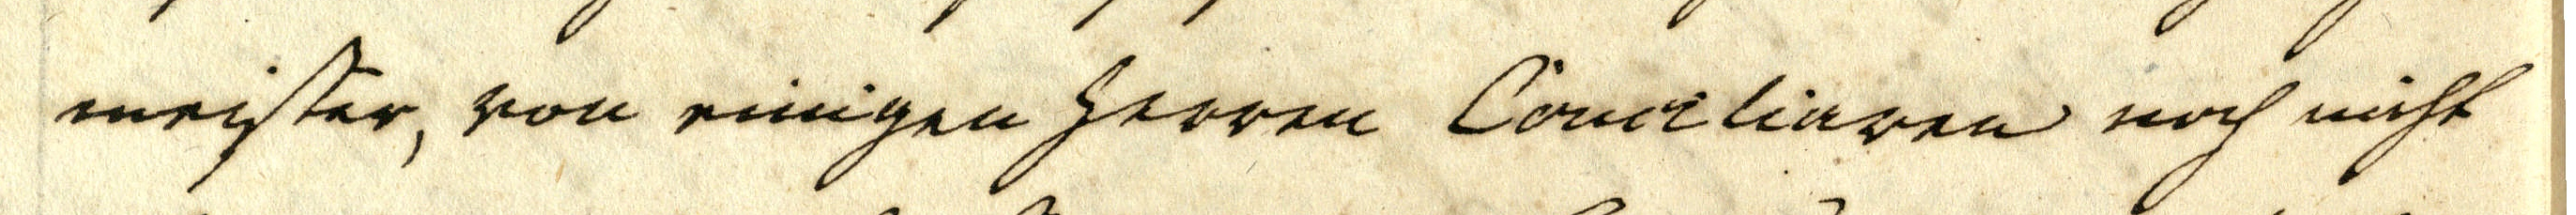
meister, von einigen Herren Conciliaren noch nicht
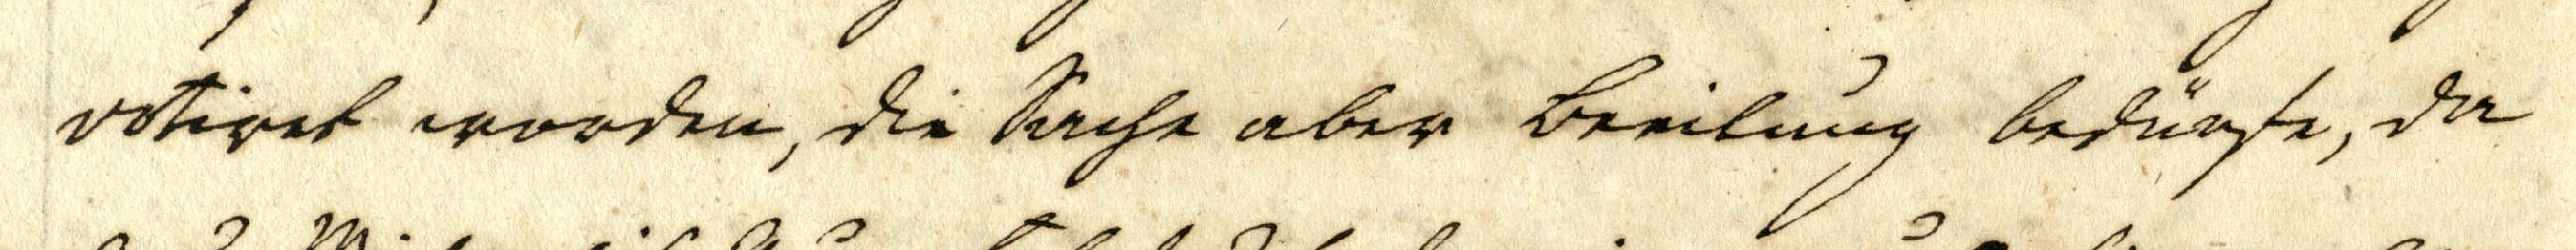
votiret worden, die Sache aber Beeilung bedürfe, da
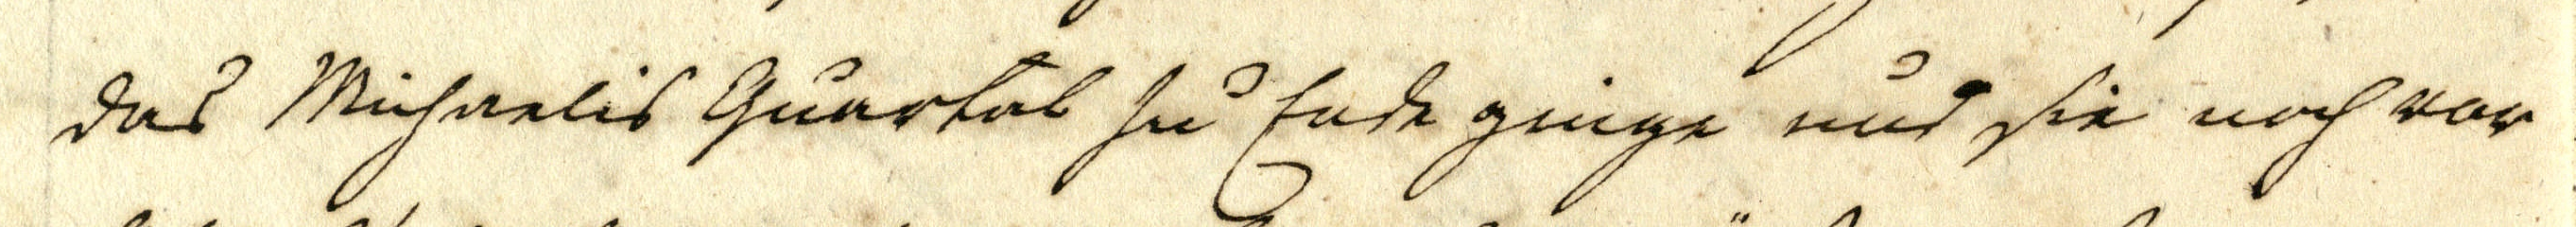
das Michaelis Quartal zu Ende ginge und sie noch vor
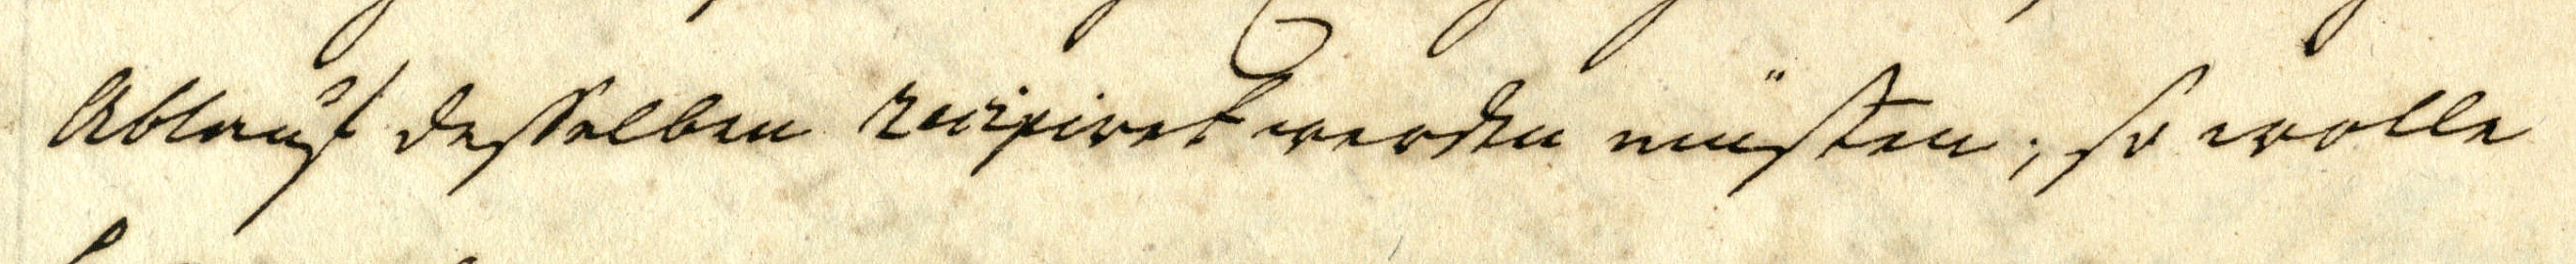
Ablauf desselben recipiret werden müßten, so wolle
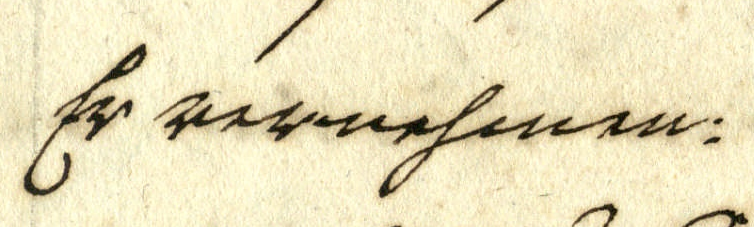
Er vernehmen:
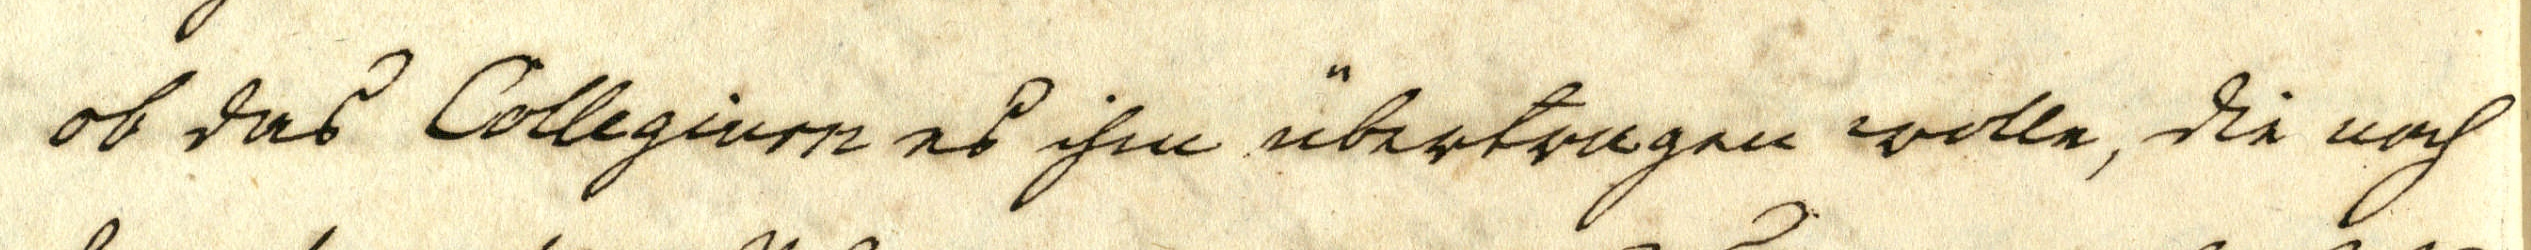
ob das Collegium es ihm übertragen wolle, die noch
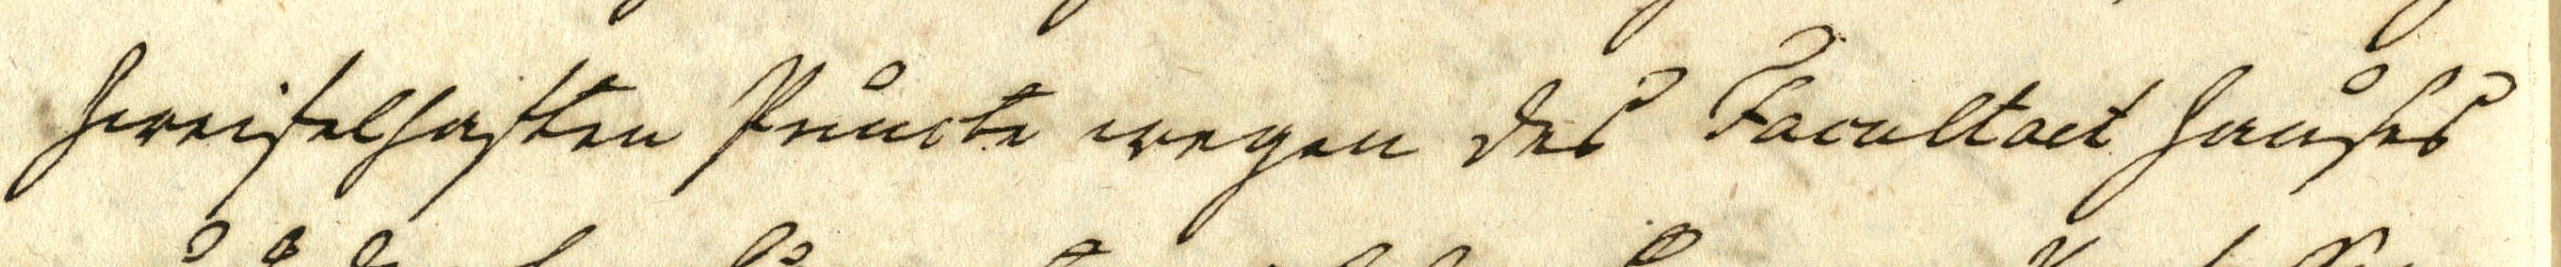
zweifelhaften Puncte wegen des Facultaet Hauses
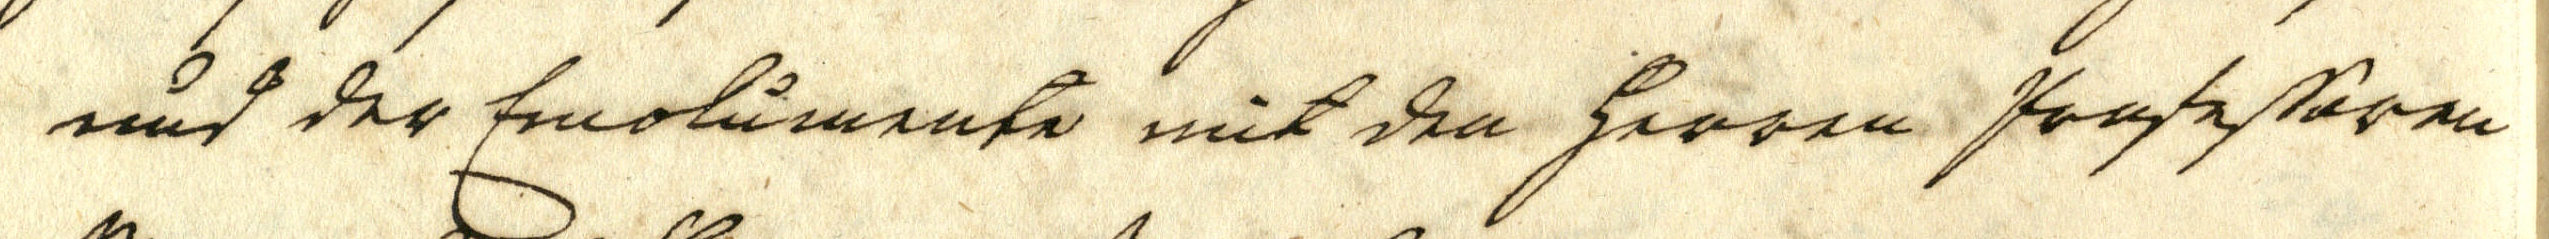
und der Emolumente mit den Herren Professoren
